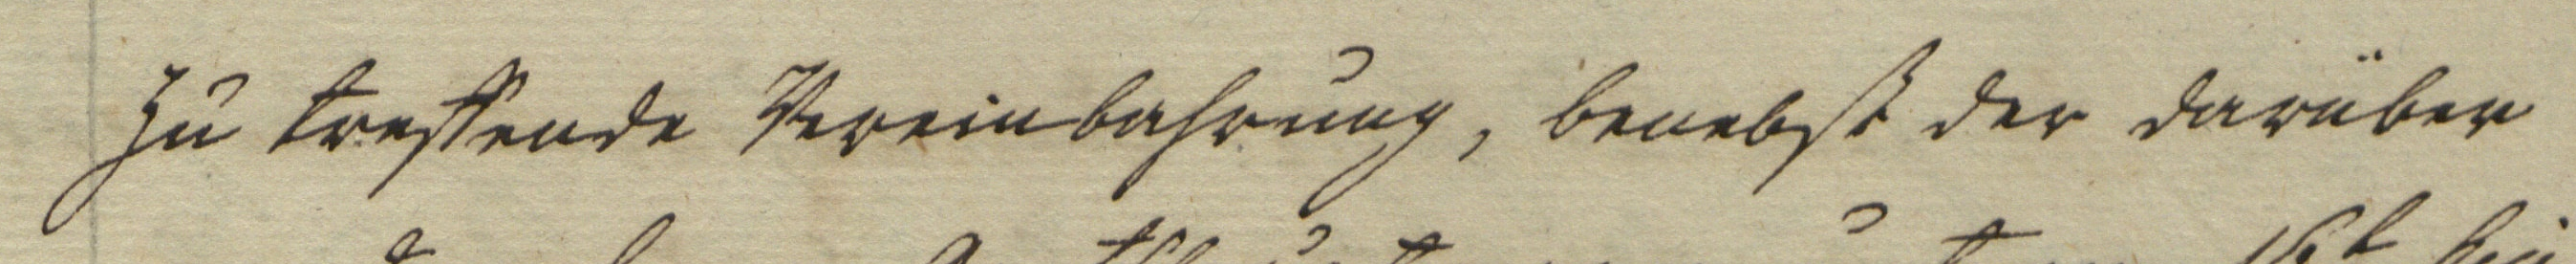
zu treffende Vereinbahrung, benebst der darüber
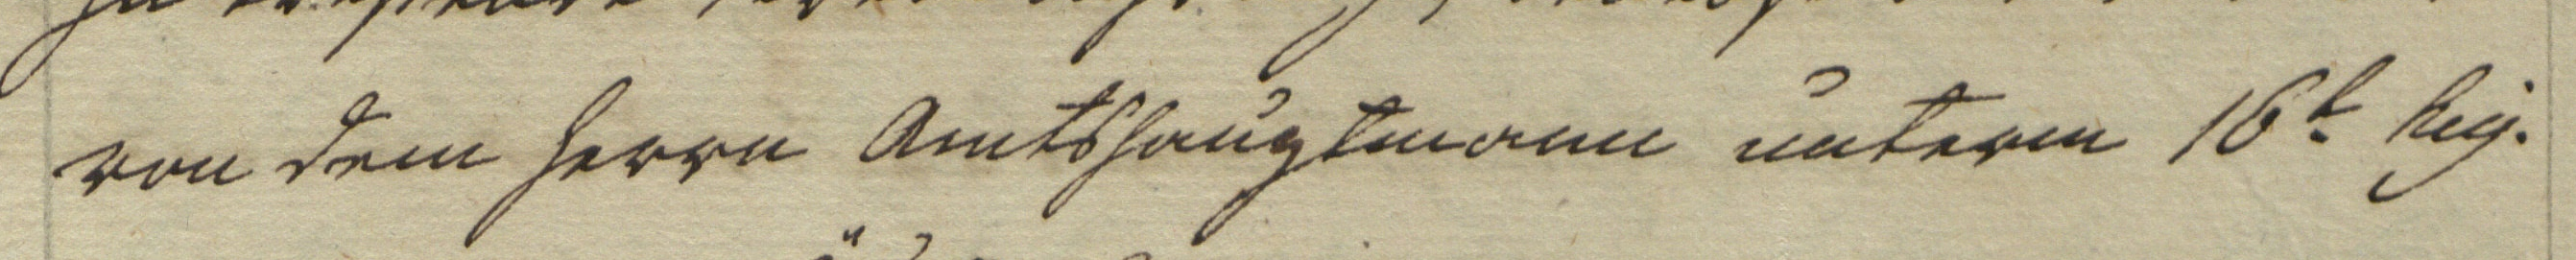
von dem Herrn Amtshauptmann unterm 16 t huj.
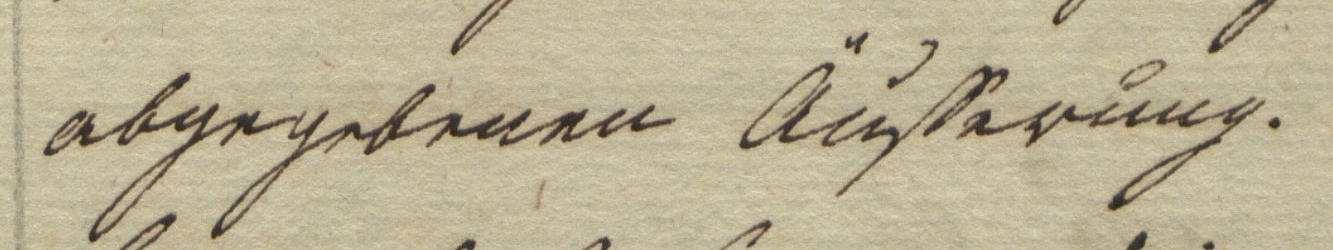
abgegebenen Äusserung.
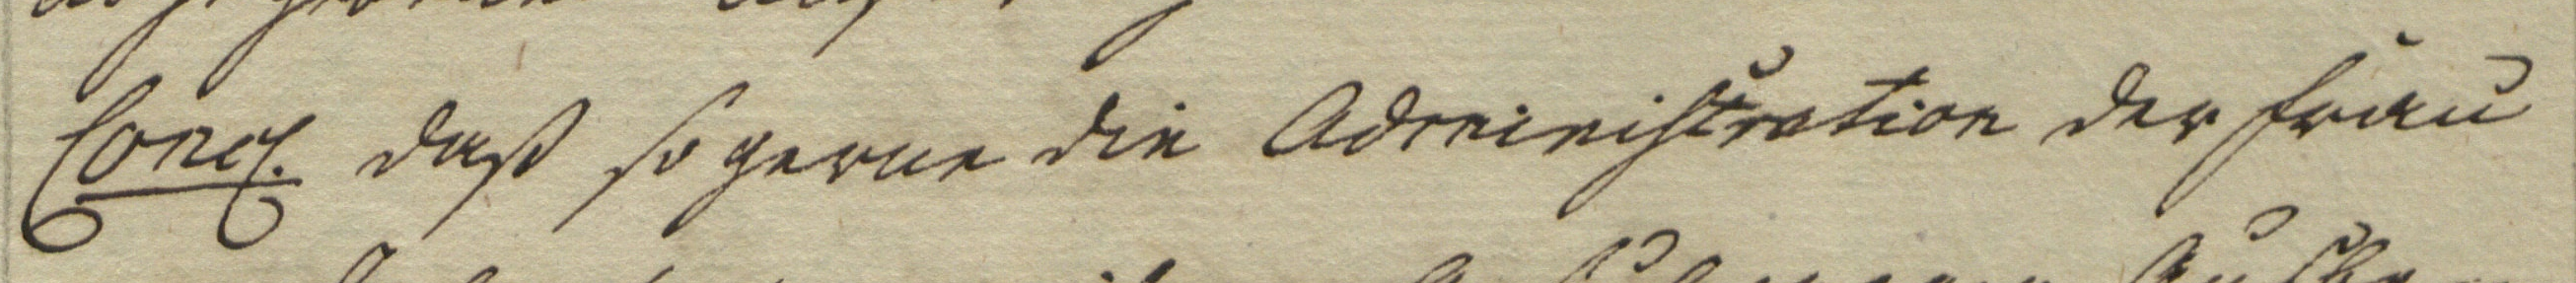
Concl. daß so gerne die Administration der Frau
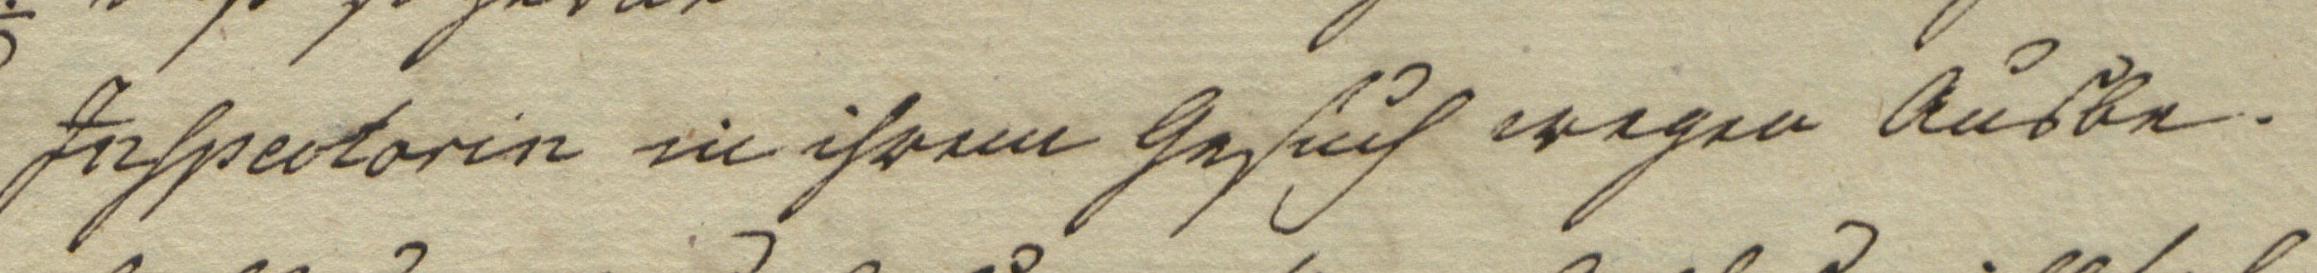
Inspectorin in ihrem Gesuch wegen Ausbe¬
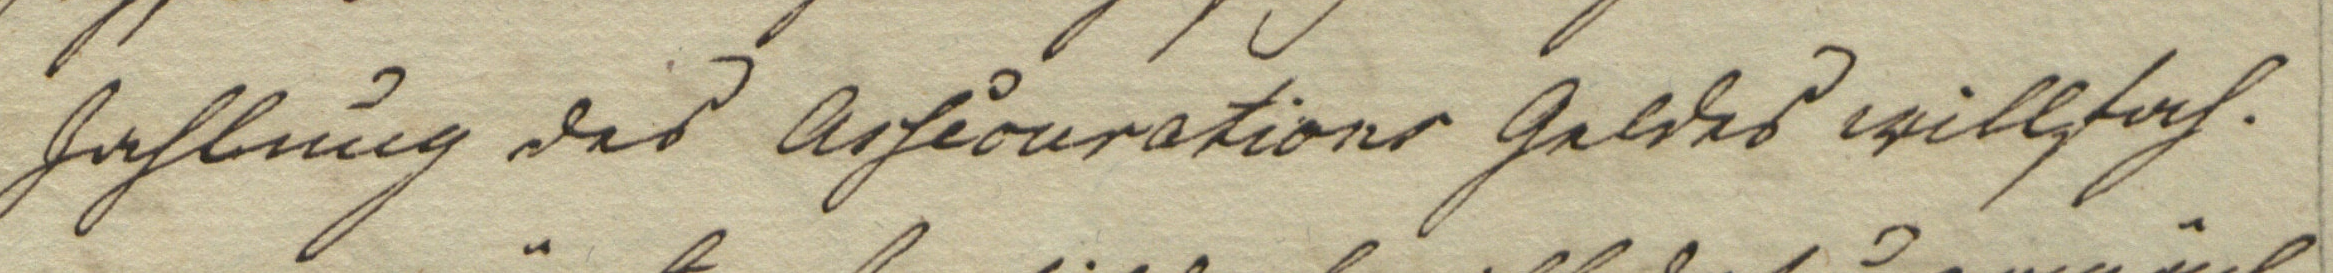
zahlung des Assecurations Geldes willfah¬
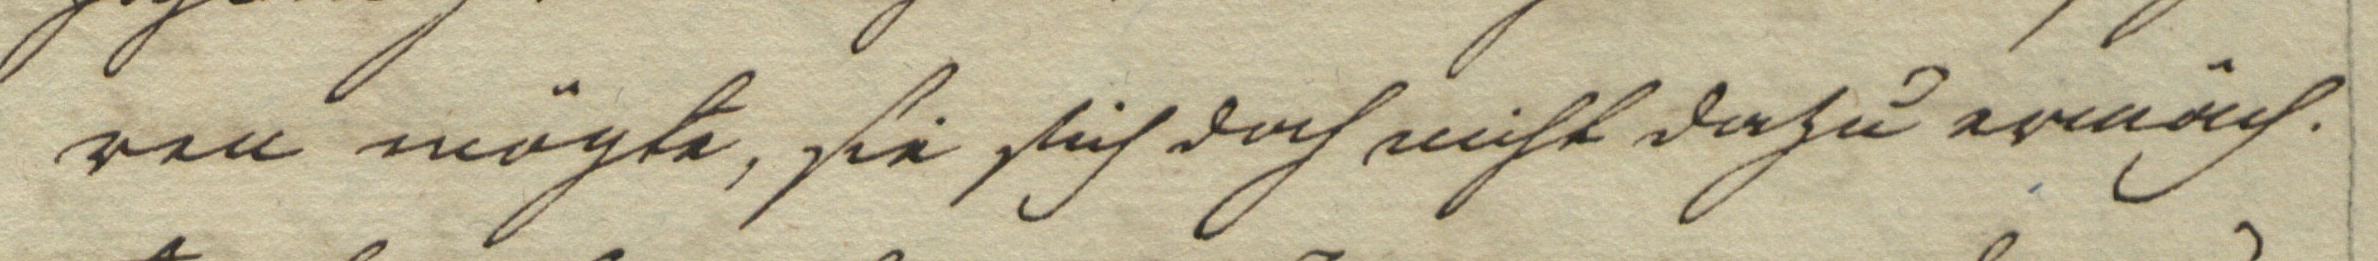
ren mögte, sie sich doch nicht dazu ermäch¬
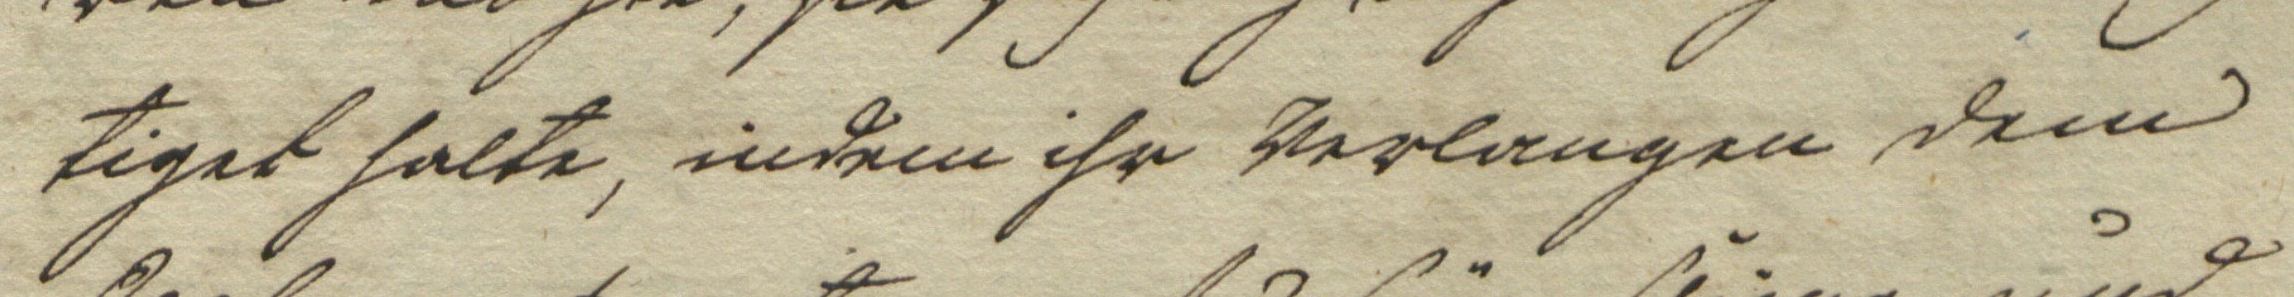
tiget halte, indem ihr Verlangen dem
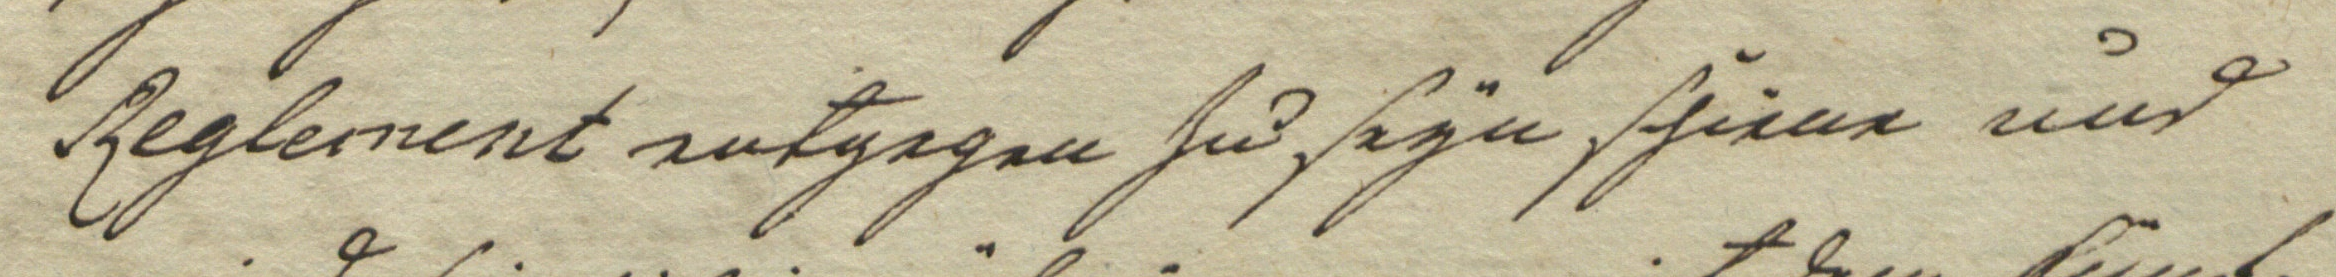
Reglement entgegen zu seÿn schiene und
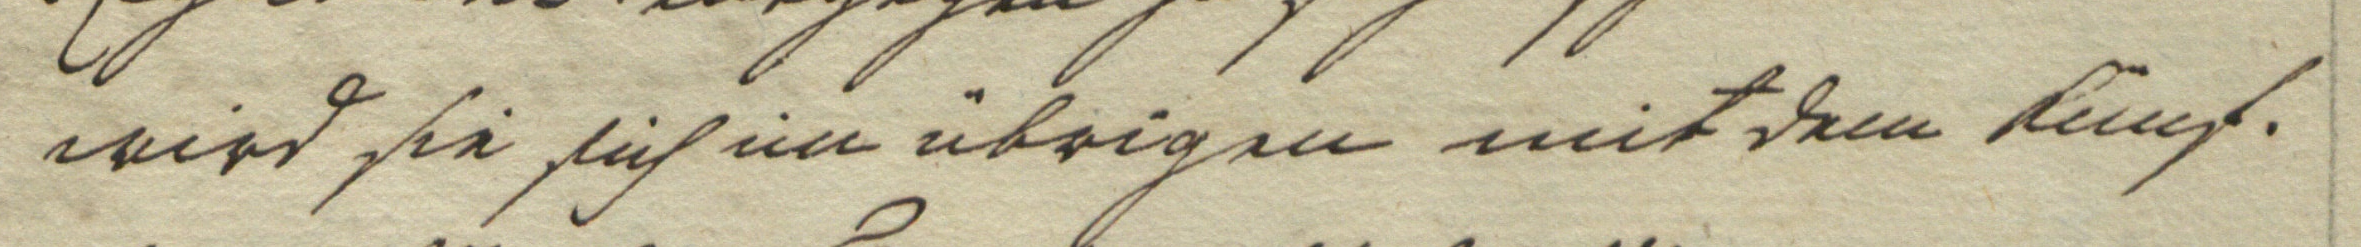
wird sie sich im übrigen mit dem künf¬
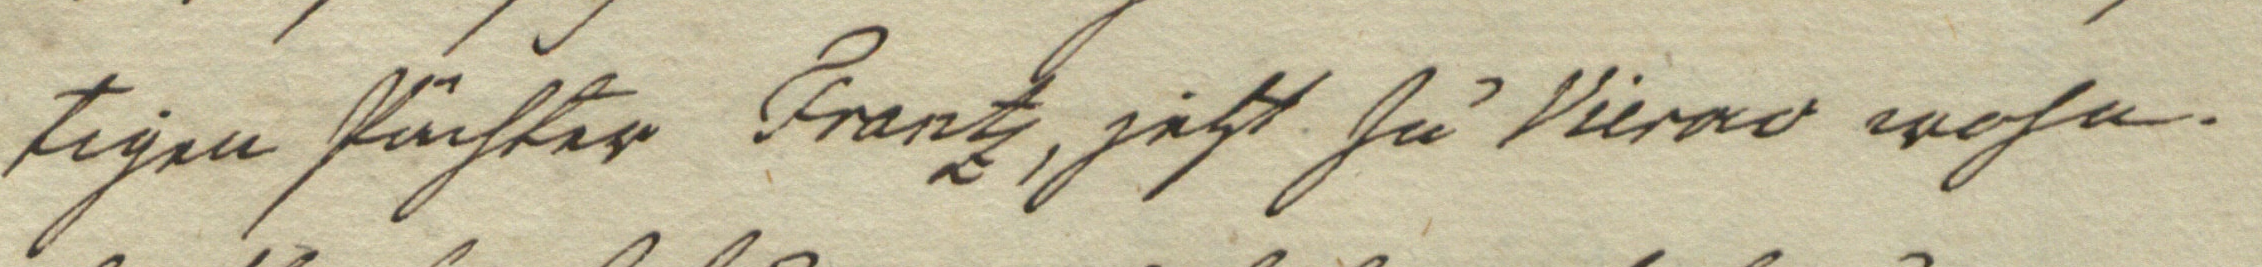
digen Pächter Frantz, jetzt zu Vierow wohn¬
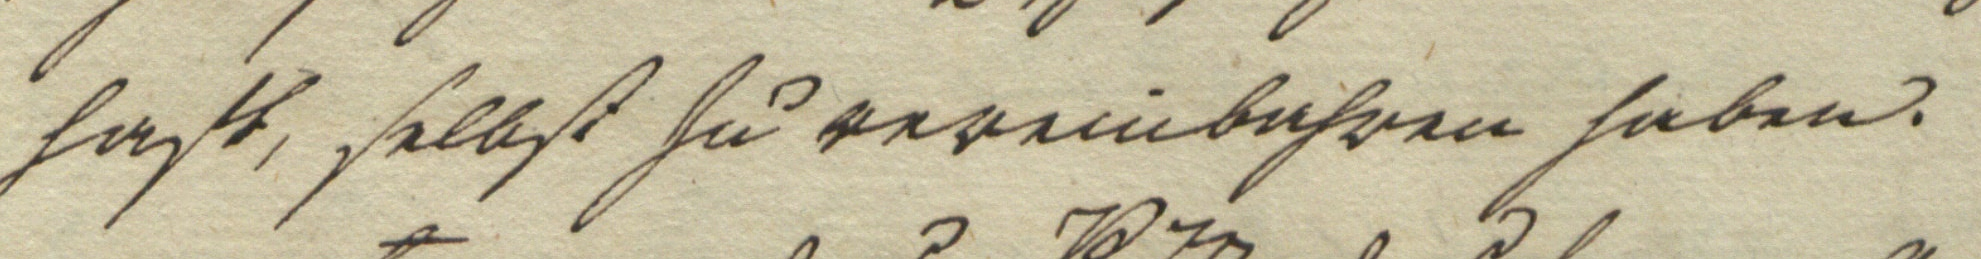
haft, selbst zu vereinbahren haben.
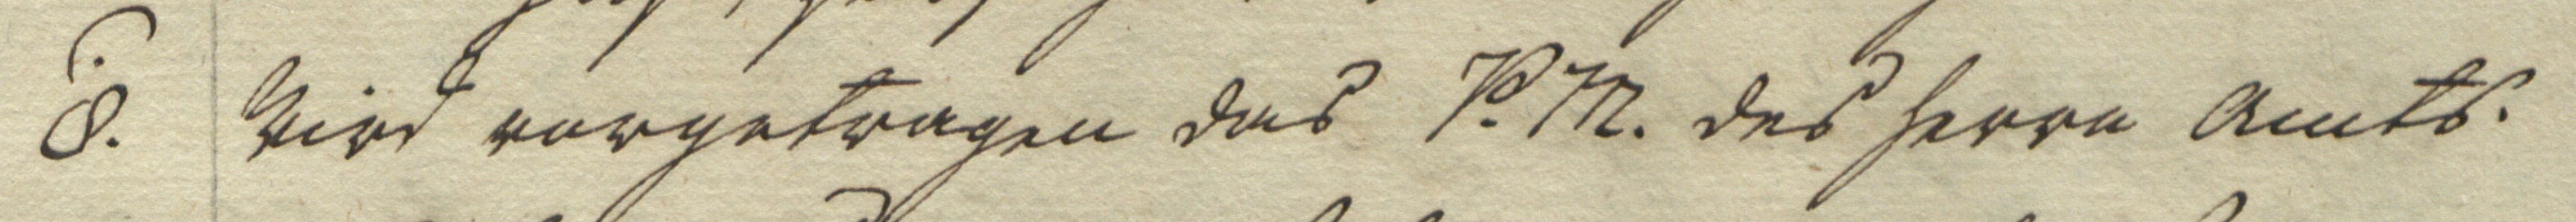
8. Wird vorgetragen das P. M. des Herrn Amts¬
